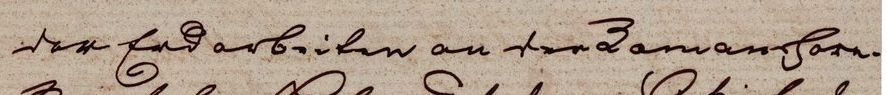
der Erdarbeiten an der Romanshorn–
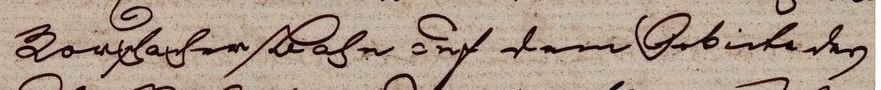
Rorschacher Bahn auf dem Gebiete des
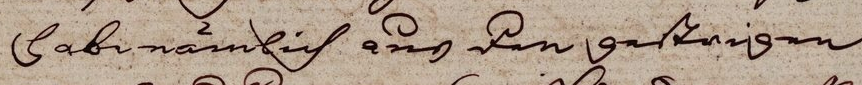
habe nämlich aus den gestrigen
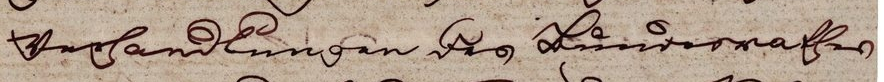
Verhandlungen des Bundesrathes
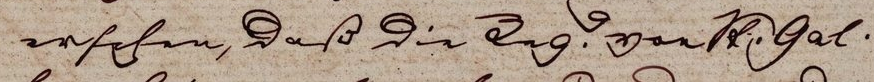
ersehen, daß die Regg von St. Gal-
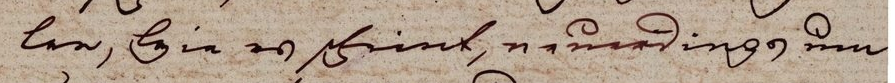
len, wie es scheint, neuerdings um
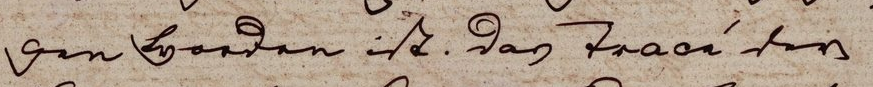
gen worden ist. Das Tracé der
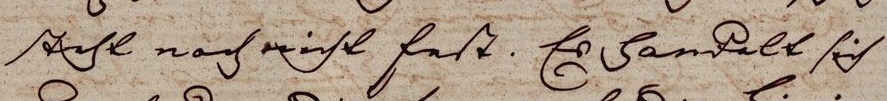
steht noch nicht fest. Es handelt sich
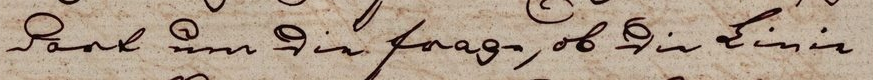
dort um die Frage, ob die Linie
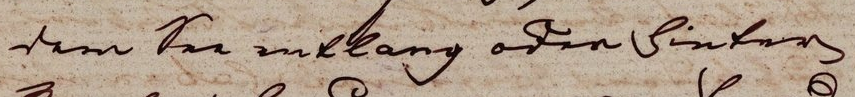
dem See entlang oder hinter
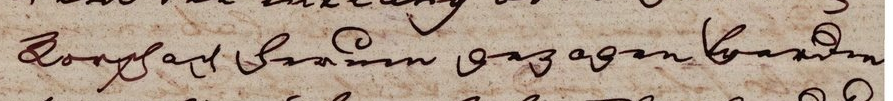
Rorschach herum gezogen werden
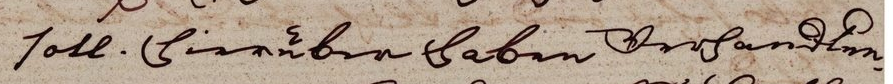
soll. Hierüber haben Verhandlun-
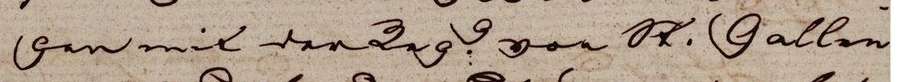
gen mit der Regg von St. Gallen
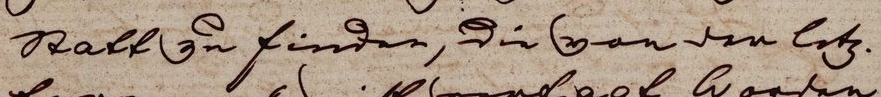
Statt zu finden, die von der letz-
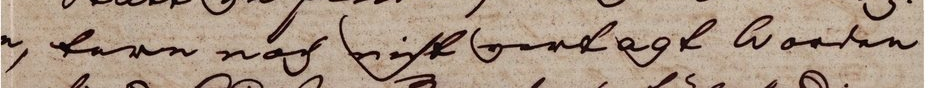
tern noch nicht vertagt worden
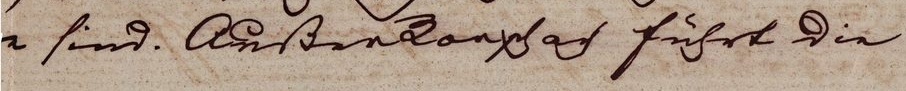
sind. Außer Rorschach führt die
